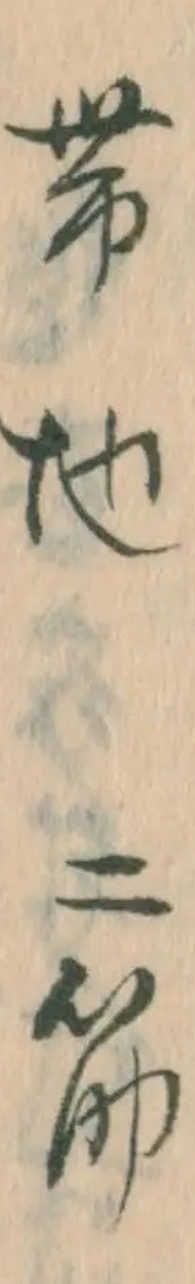帯地二筋
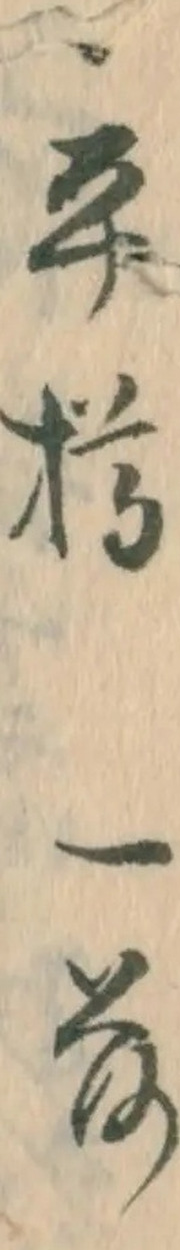平樽一荷
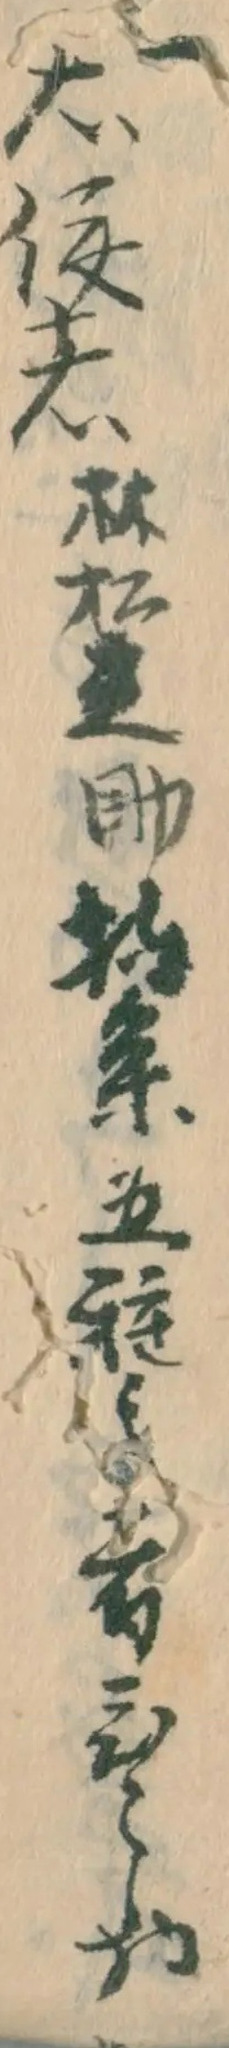右使者林松之助持参五種之肴ひたし物

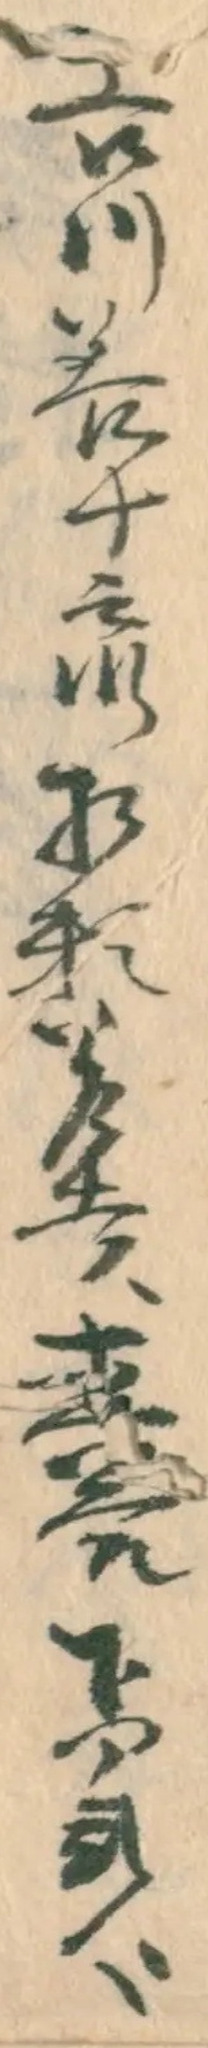吉川善十郎相頼差出ス直答下部弐人へ
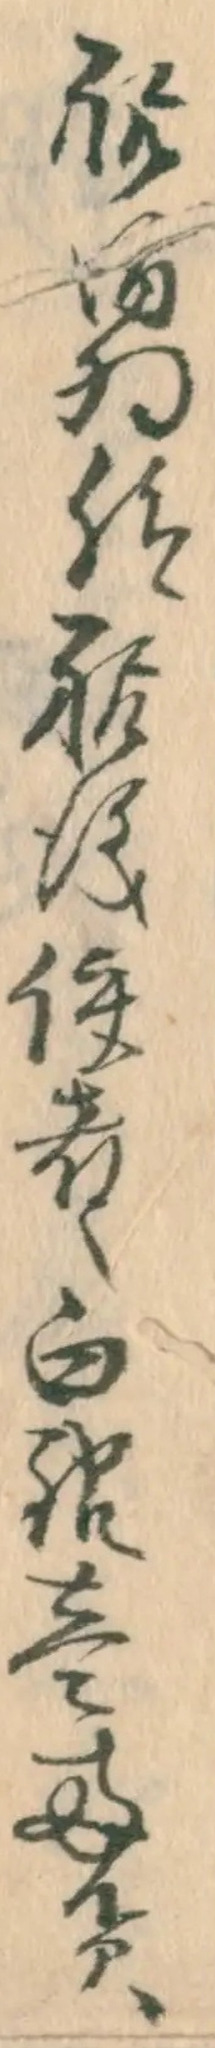祝酒為給祝儀使者へ白銀壱両下部へ
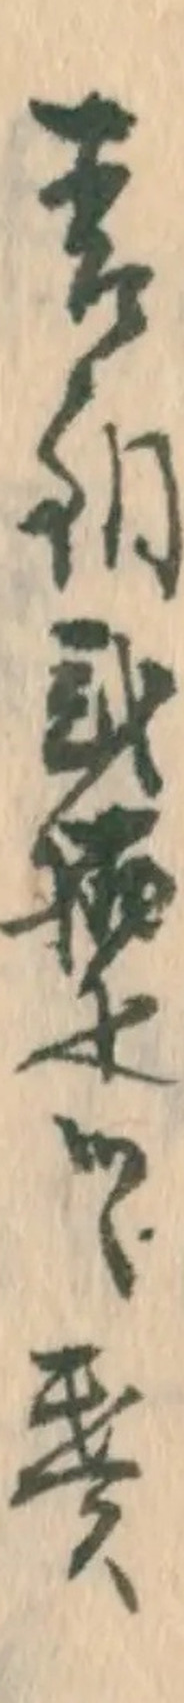青銅弐拾疋ツヽ遣ス
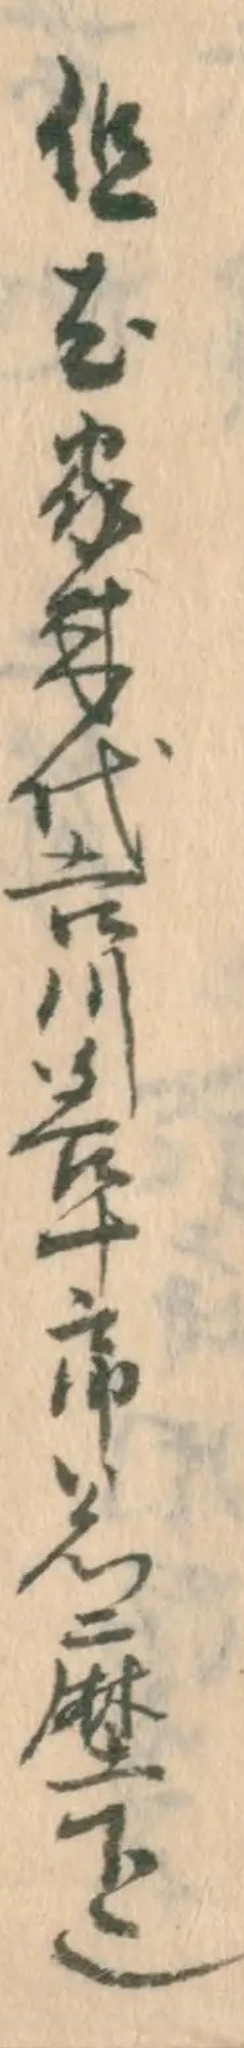但尤家来代吉川善十郎着麻上下也
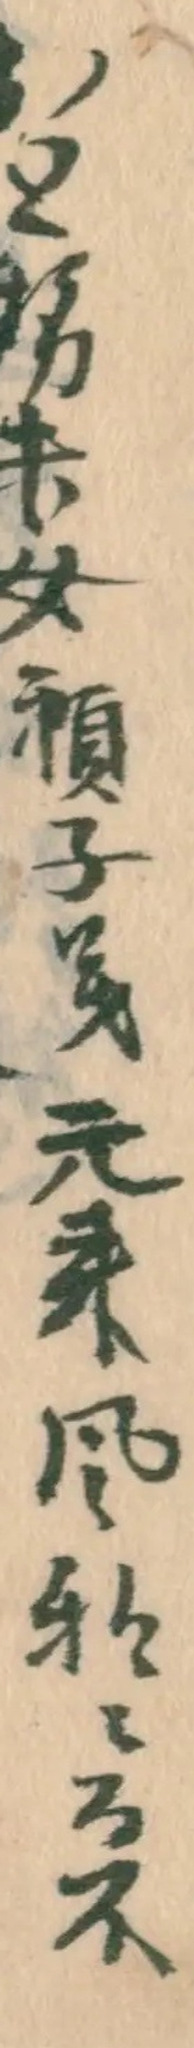一おと勢末女頼子義元来風邪ニ而不
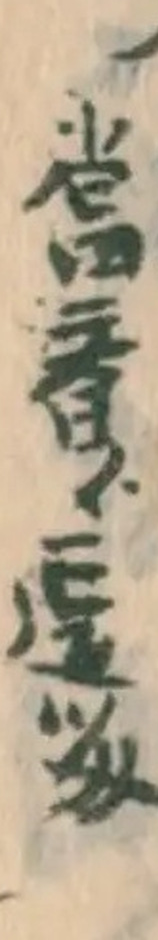当春ゟ逗留
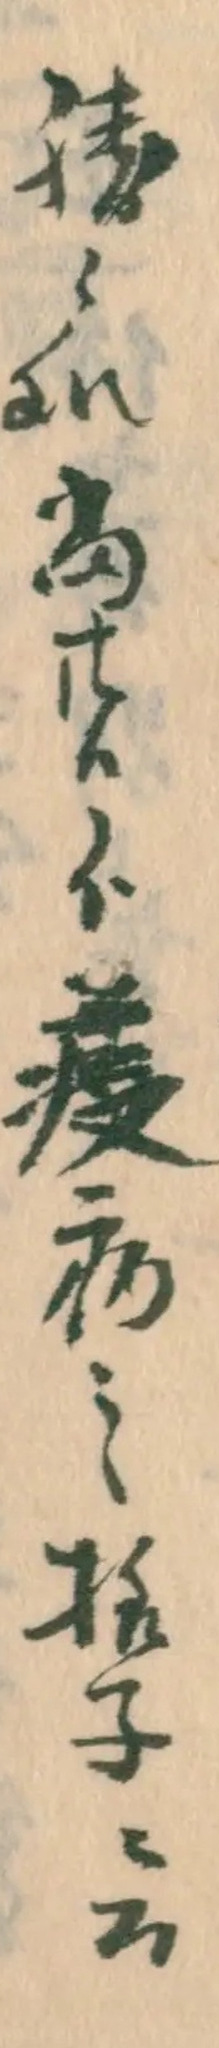勝候処当廿日ゟ疫病之様子ニ而
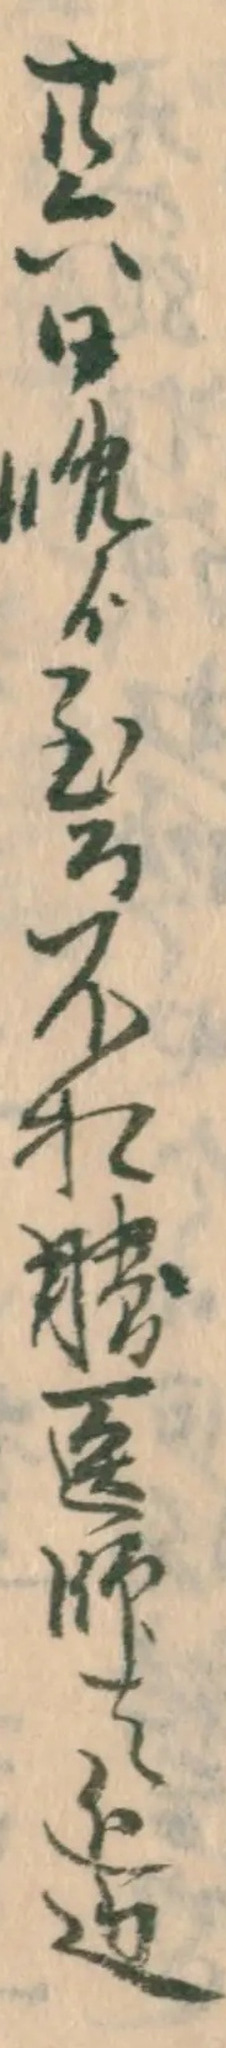廿六日晩ゟ至而不相勝医師は近辺
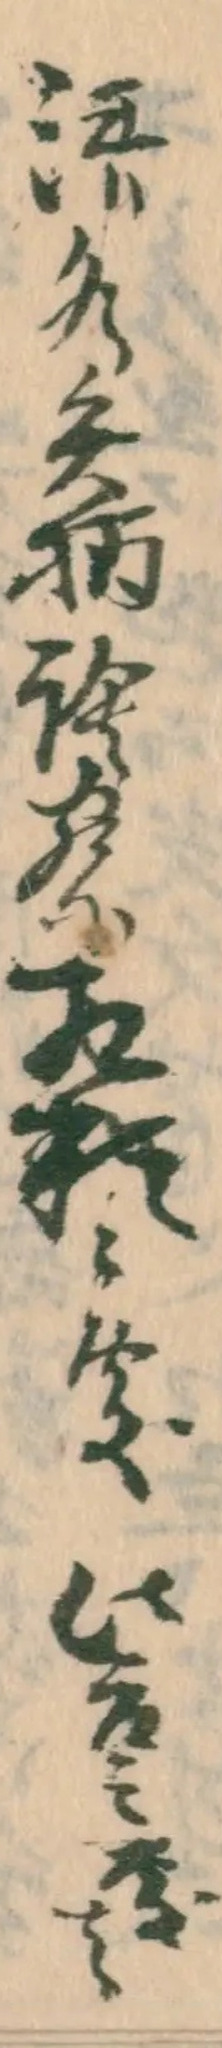清水矢柄診察相頼候処此度之処は
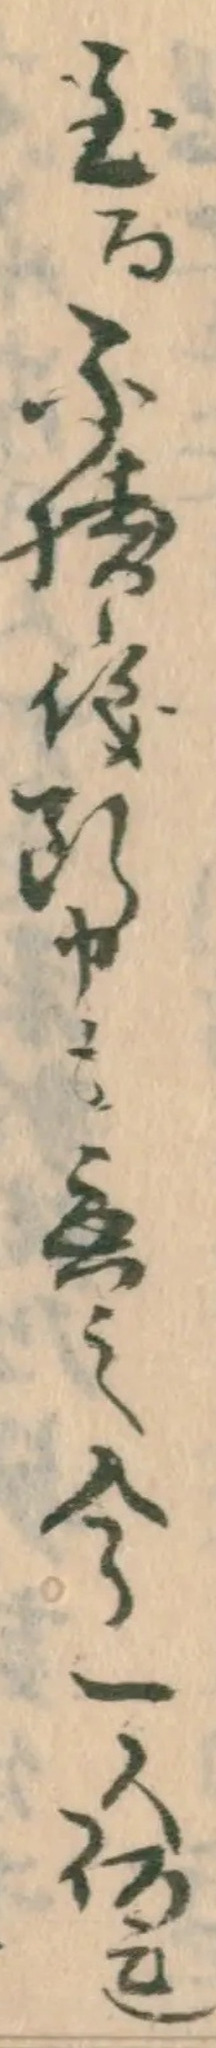至而不勝候儀断申も無之今一人何れ
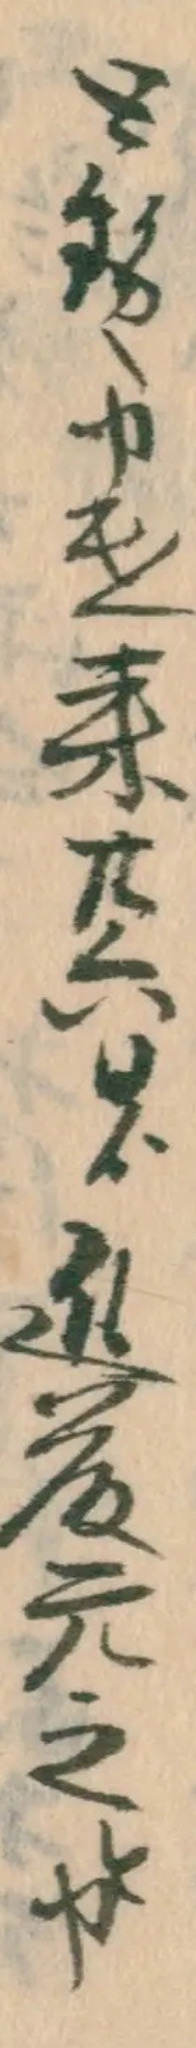と勢へ申遣来廿六日ゟ近藤元之と申
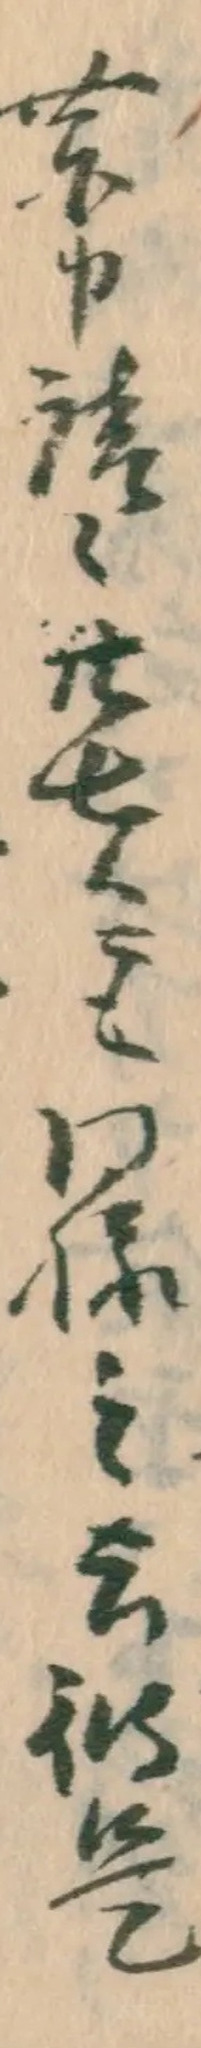薬申請候廿七日ニも同様之旨彼是
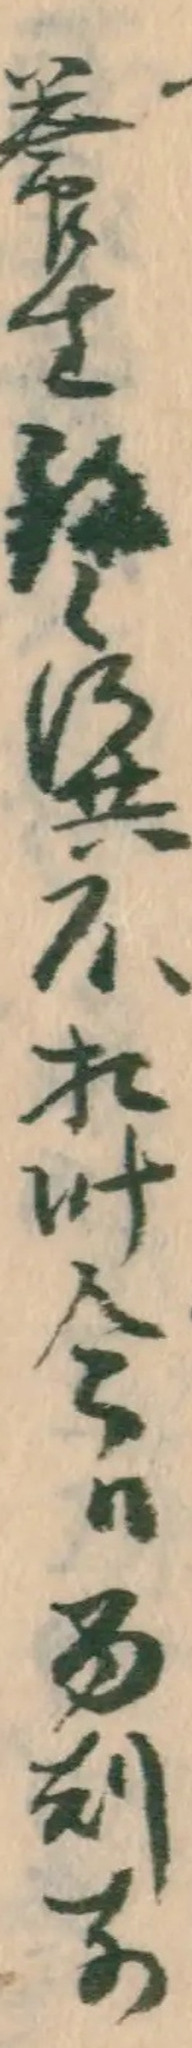養生致候得共不相叶今日酉刻前
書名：禁裏御所御用日記. [131]
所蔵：国立国会図書館 National Diet Library, JAPAN
